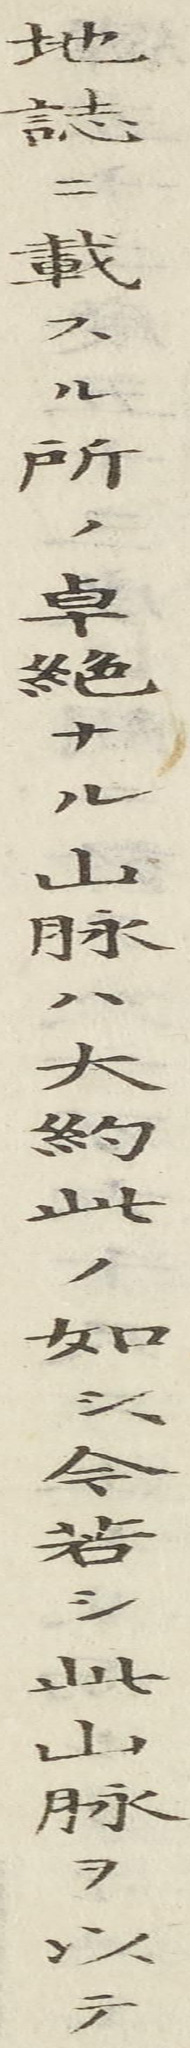地誌ニ載スル所ノ卓絶ナル山脉ハ大約此ノ如シ、今若シ此山脉ヲ以テ
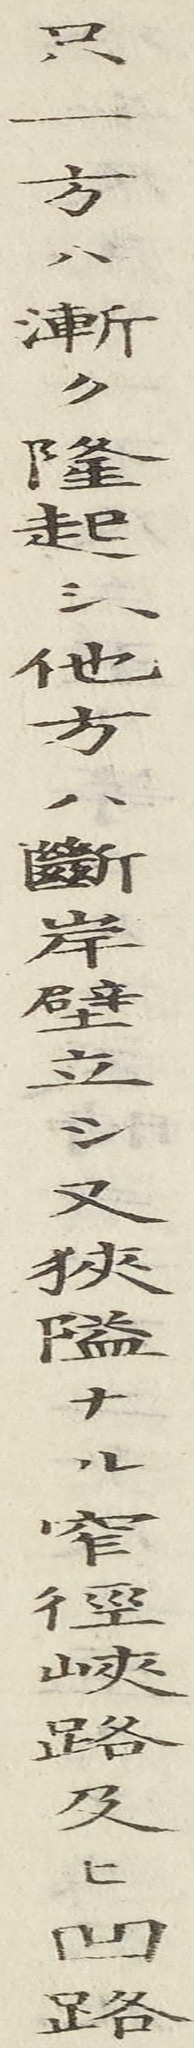只一方ハ漸ク隆起シ、他方ハ断岸壁立シ又狭隘ナル窄径峡路及ヒ凹路
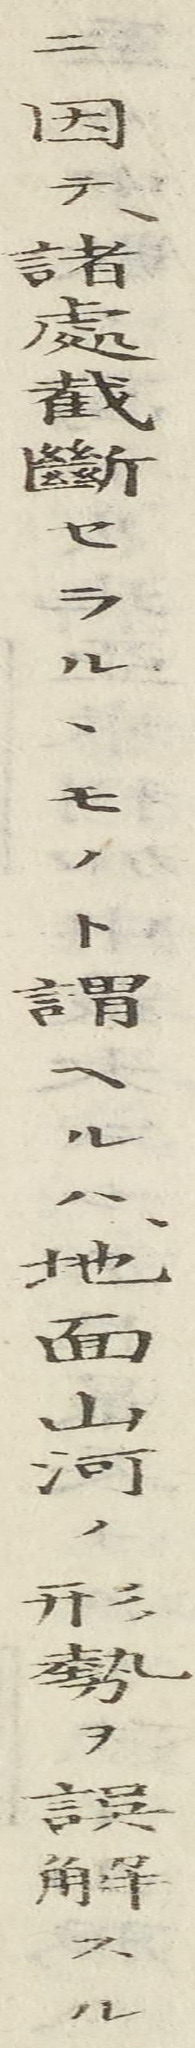ニ因テ、諸処截断セラルヽモノト謂ヘルハ、地面山河ノ形勢ヲ誤解スル
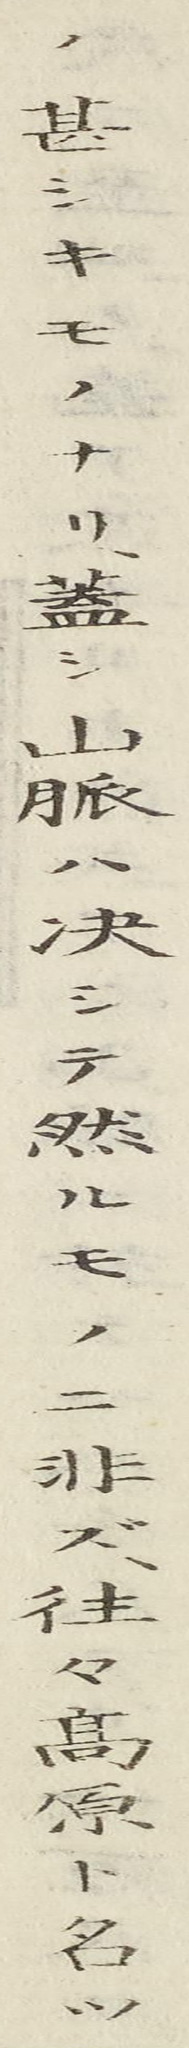ノ甚シキモノナリ、蓋シ山脈ハ決シテ然ルモノニ非ズ、往々高原ト名ツ
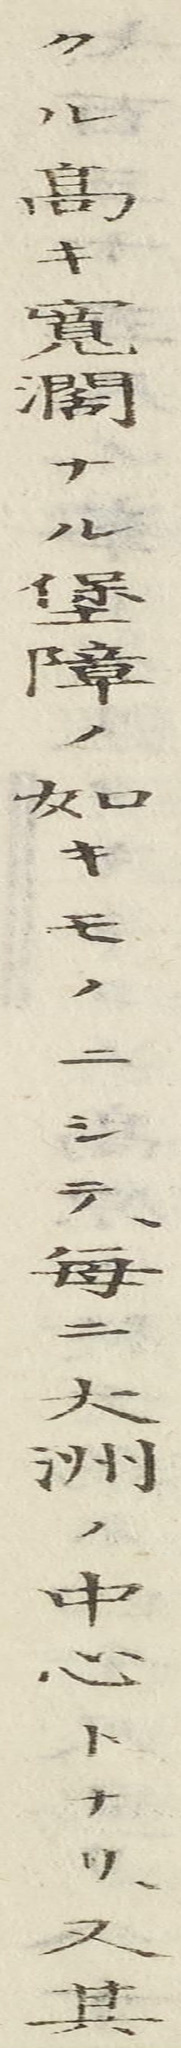クル高キ寛濶ナル堡障ノ如キモノニシテ、毎ニ大洲ノ中心トナリ、又其
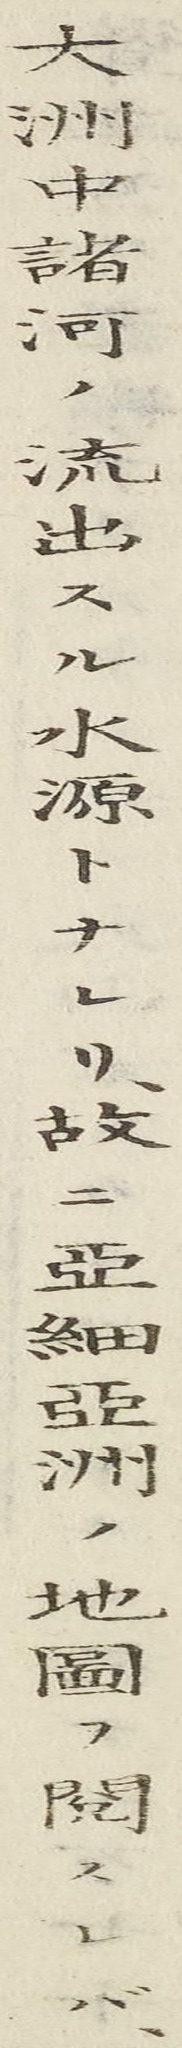大洲中諸河ノ流出スル水源トナレリ、故ニ亜細亜洲ノ地図ヲ閲スレバ、
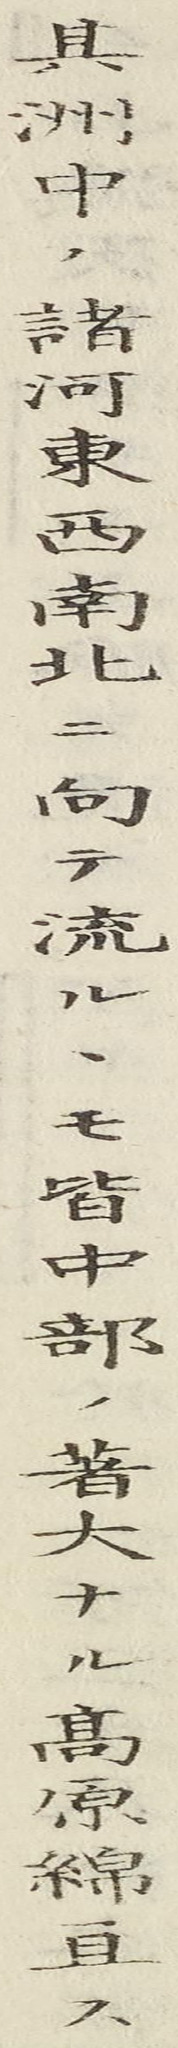其洲中ノ諸河東西南北ニ向テ流ルヽモ皆中部ノ著大ナル高原綿亘ス
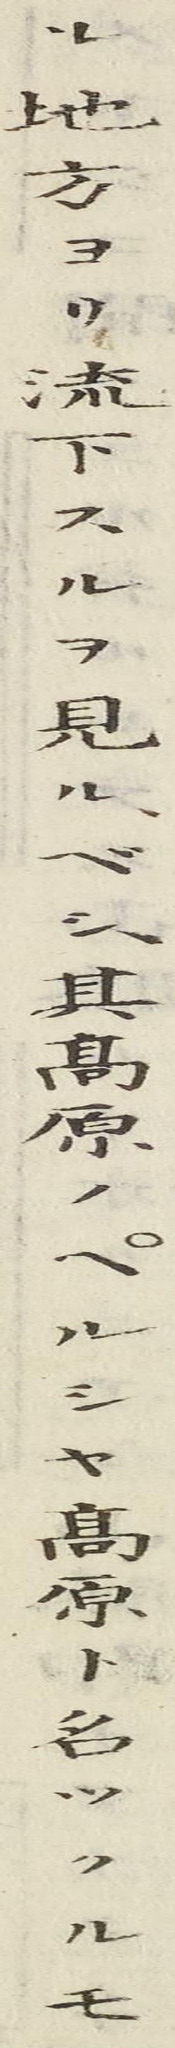ル地方ヨリ流下スルヲ見ルベシ、其高原ノペルシヤ高原ト名ツクルモ
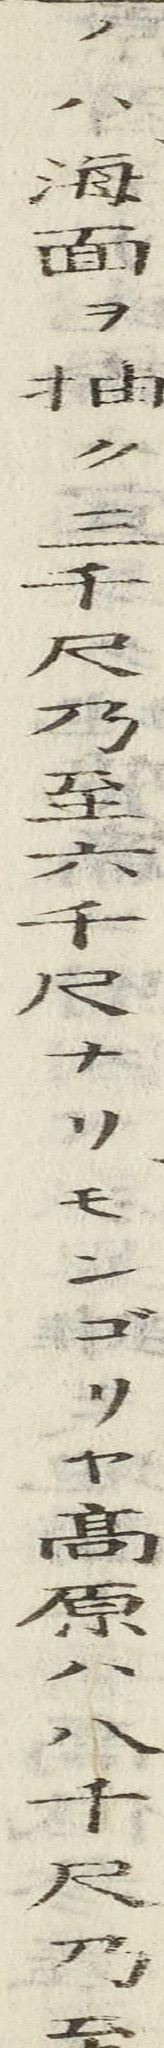ノハ、海面ヲ抽ク三千尺乃至六千尺ナリ、モンゴリヤ高原ハ八千尺乃至
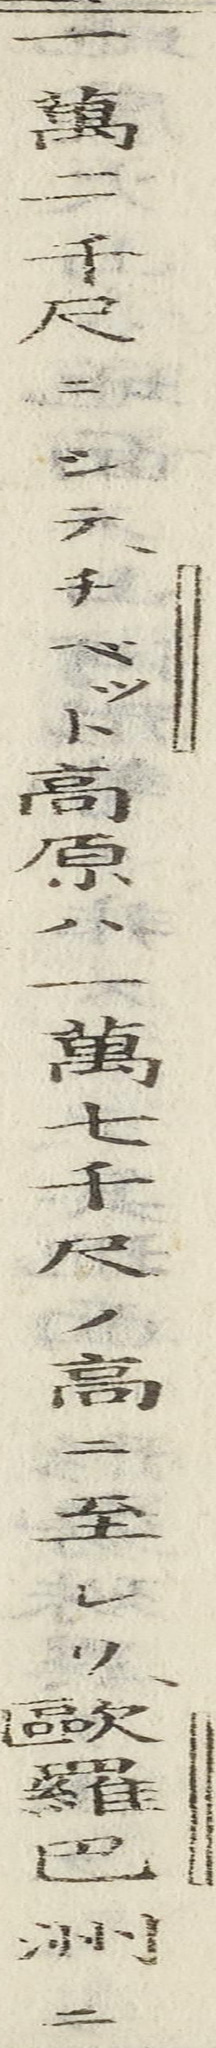一万二千尺ニシテ、チベット高原ハ一万七千尺ノ高ニ至レリ、欧羅巴洲ニ
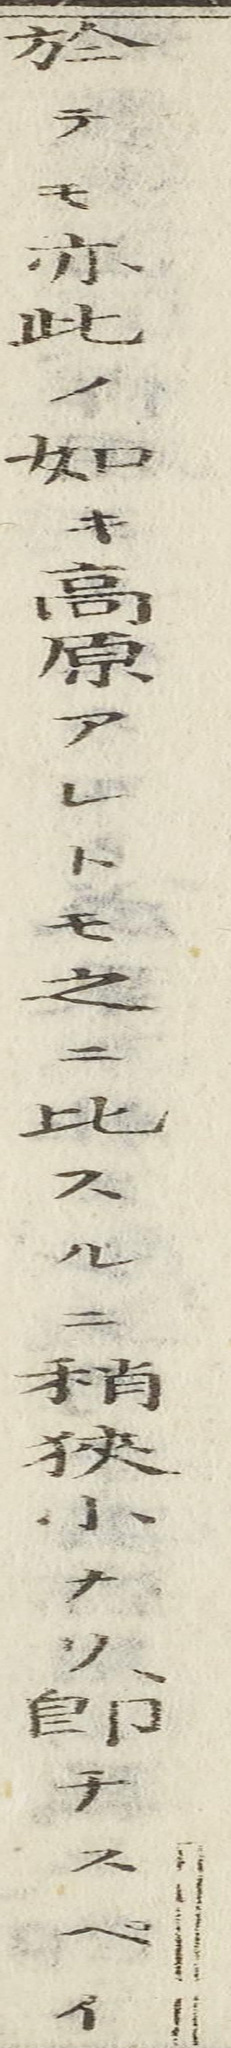於テモ亦此ノ如キ高原アレトモ之ニ比スルニ稍狭小ナリ、即チスペイ
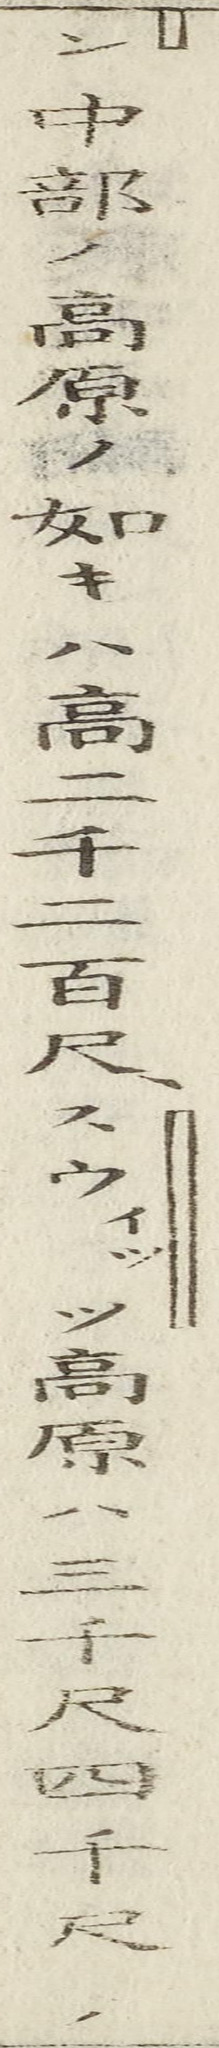ン中部ノ高原ノ如キハ高二千二百尺、スウィッツ高原ハ三千尺四千尺ノ
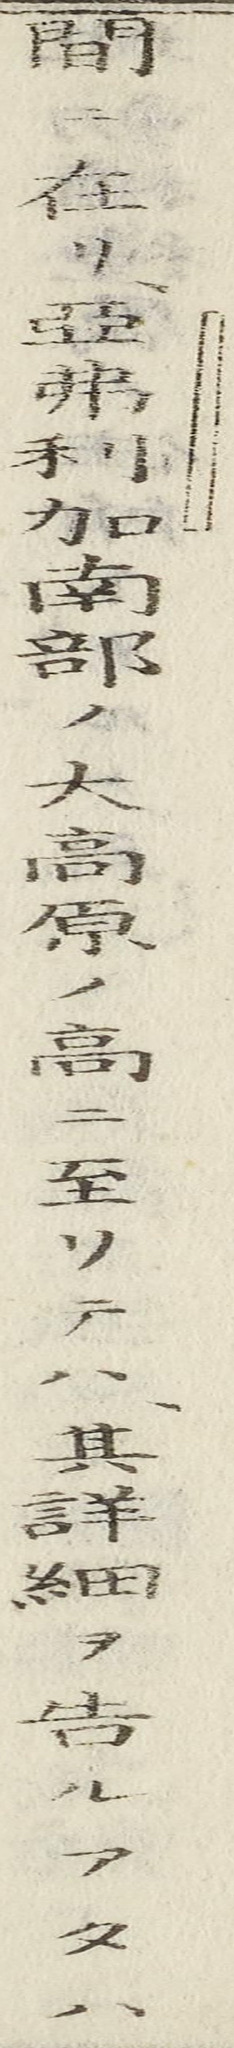間ニ在リ、阿弗利加南部ノ大高原ノ高ニ至リテハ、其詳細ヲ告ルアタハ
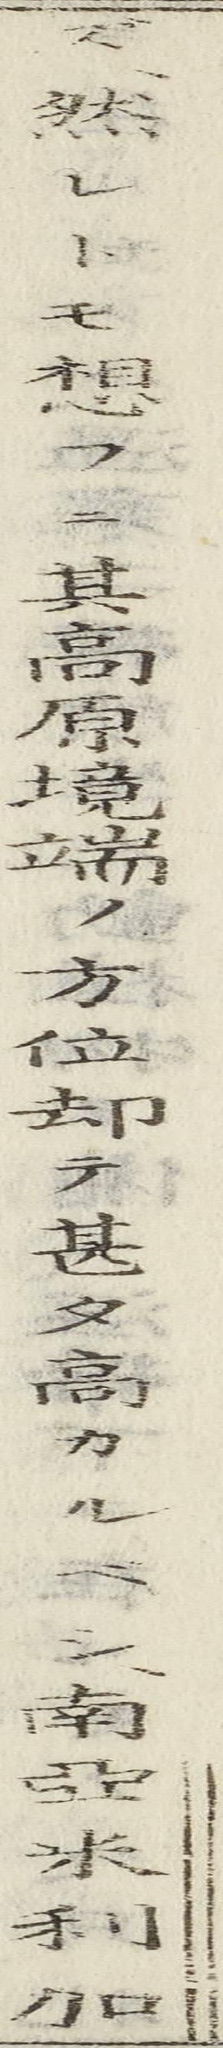ズ、然レトモ想フニ其高原境端ノ方位却テ甚タ高カルベシ、南亜米利加
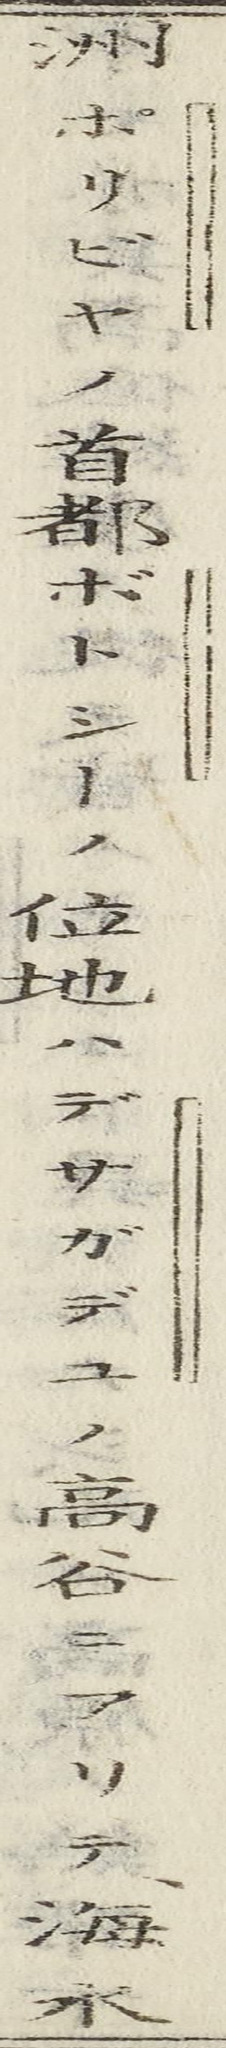洲ポリビヤノ首都ボトシーノ位地ハデサガデユノ高谷ニアリテ、海水
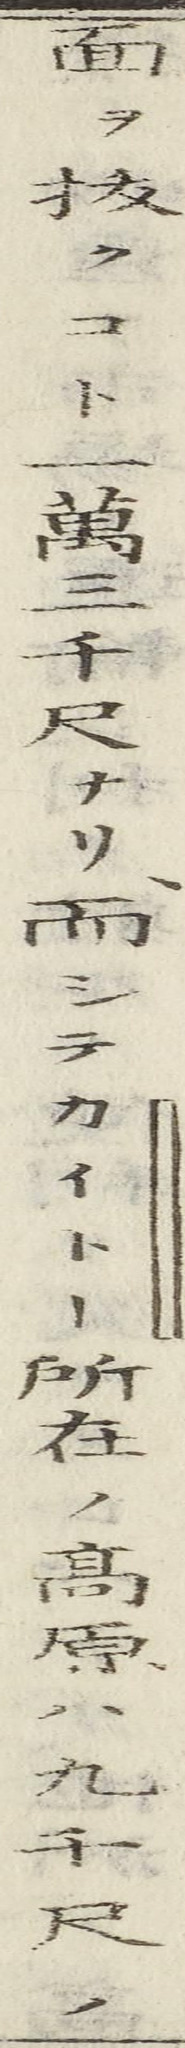面ヲ抜クコト一万三千尺ナリ、而シテカイトー所在ノ高原ハ九千尺ノ
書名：百科全書　地文學　全
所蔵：東京大学地震研究所図書室 Earthquake Research Institute Library, The University of Tokyo, JAPAN
